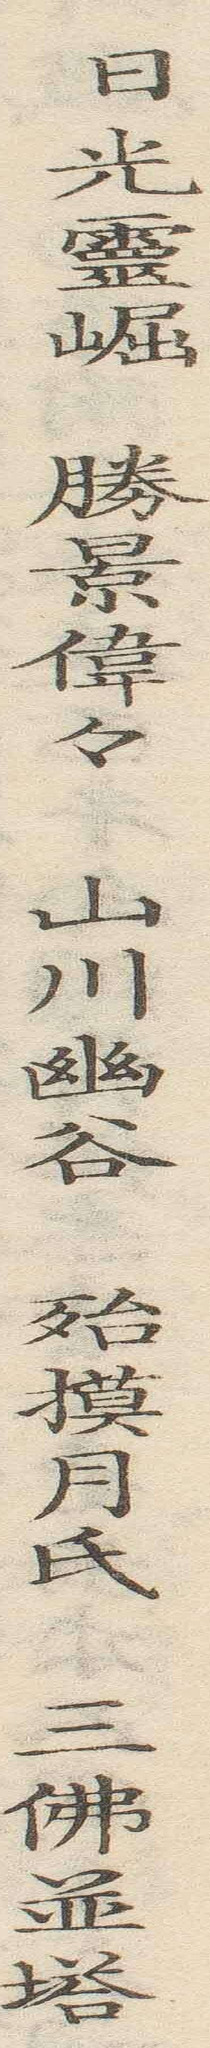日光靈崛勝景偉々山川幽谷殆摸月氏三佛並塔
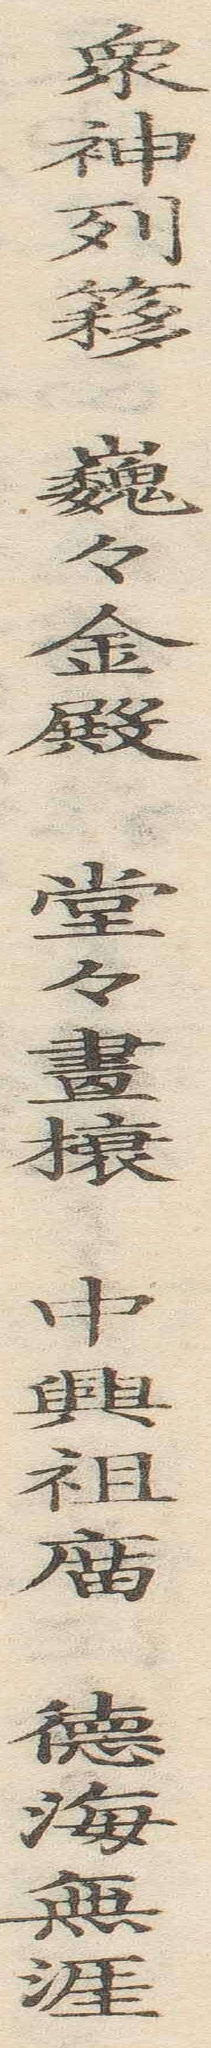衆神列簃巍々金殿堂々畫榱中興祖庿德海無涯
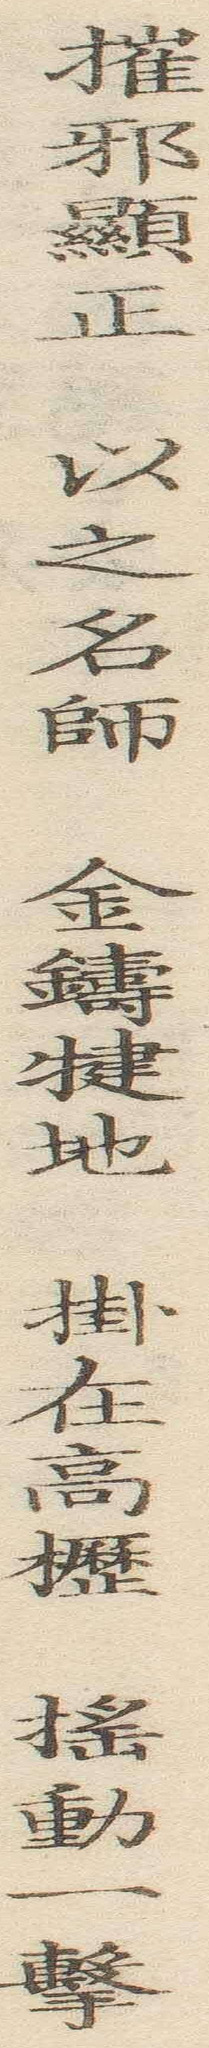摧邪顯正以之名師金鑄犍地掛在高櫪搖動一擊
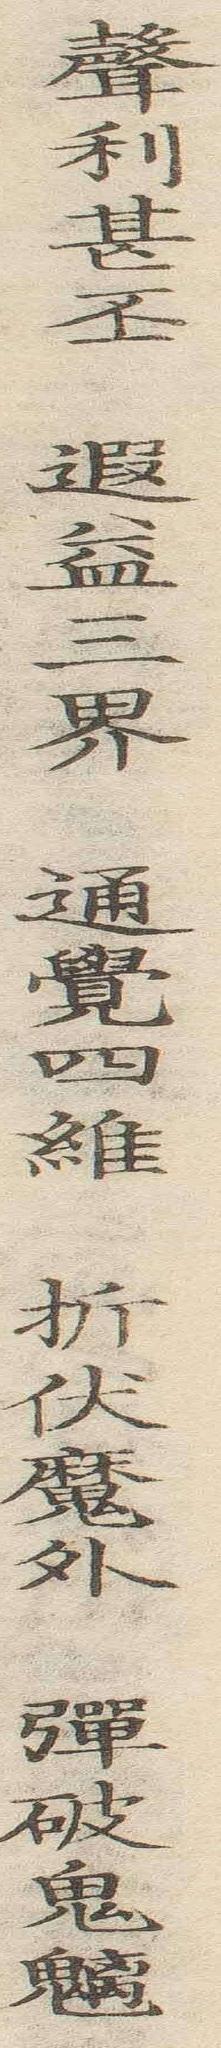聲利甚丕遐益三界通覺四維折伏魔外彈破鬼魑
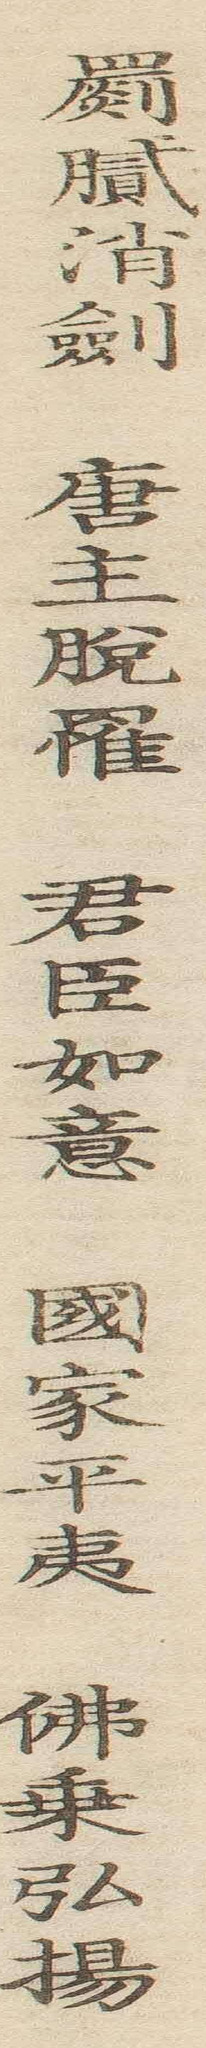罽膩消劍唐主脫罹君臣如意國家平夷佛乗弘揚
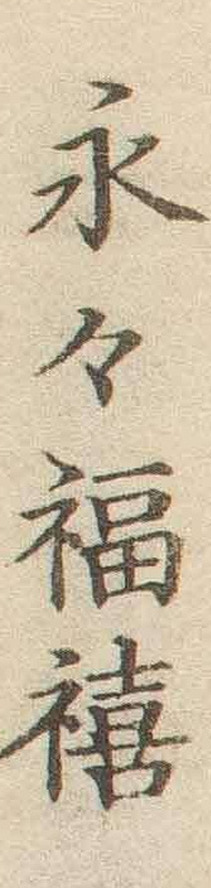永々福禧

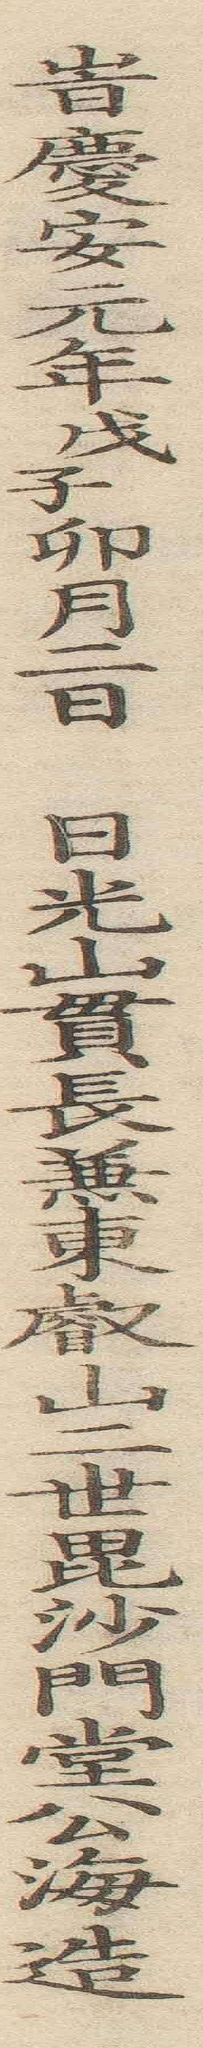旹慶安元年戊子卯月二日日光山貫長兼東叡山二世毘沙門堂公海造
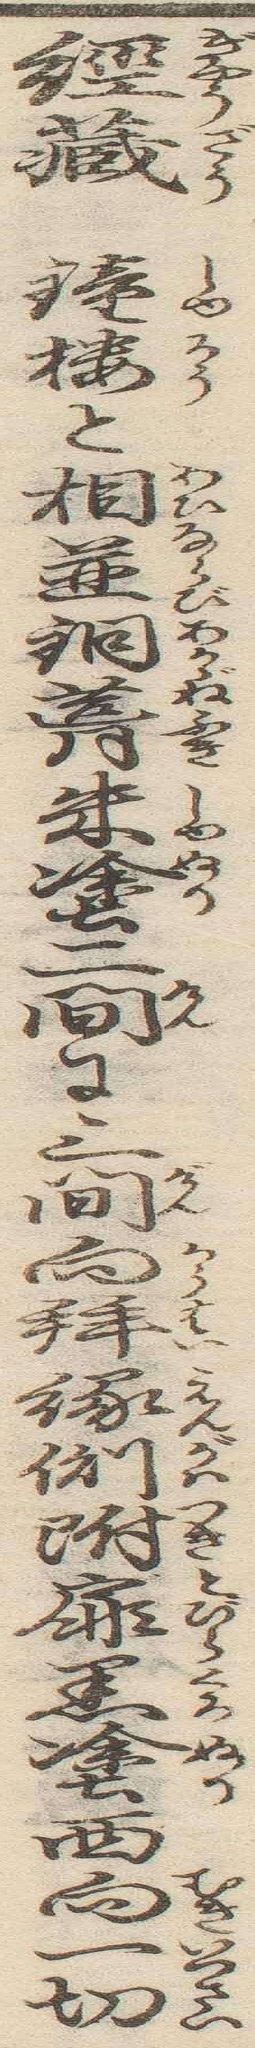經藏鐘楼と相並銅葺朱塗二間に三間向拜縁側附扉黒塗西向一切
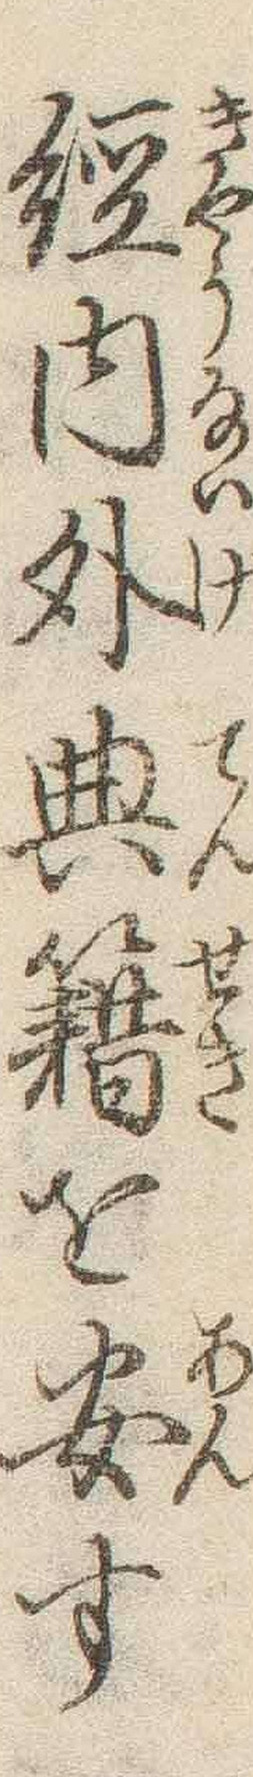經内外典籍を安す
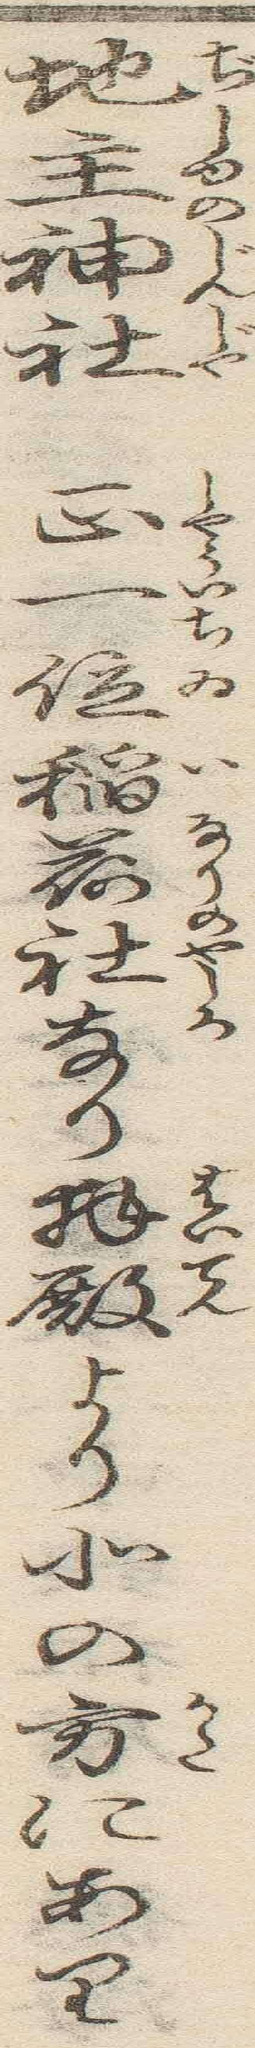地主神社正一位稲荷社なり拜殿より北の方にあり
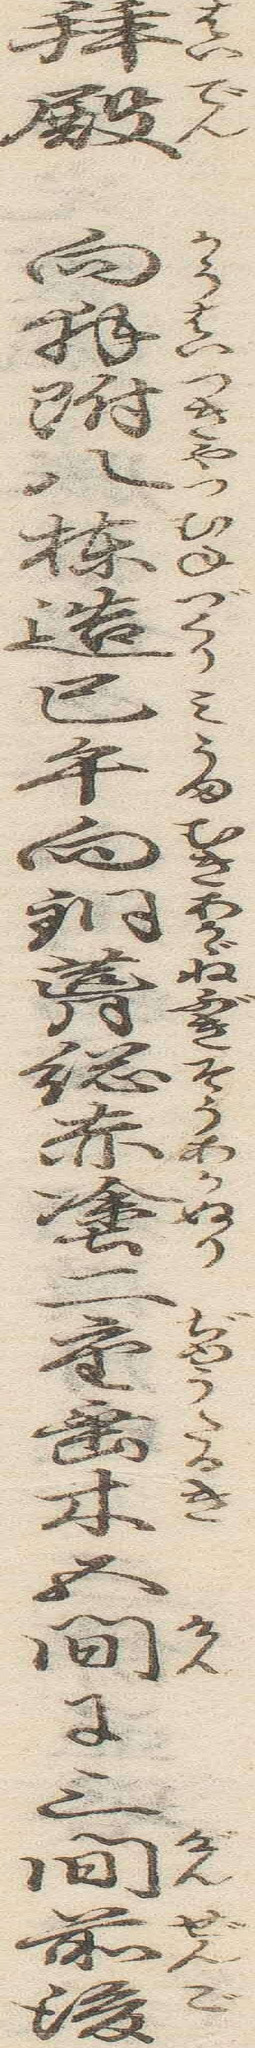拜殿向拜附八棟造巳午向銅葺総赤塗二重垂木五間に三間前後
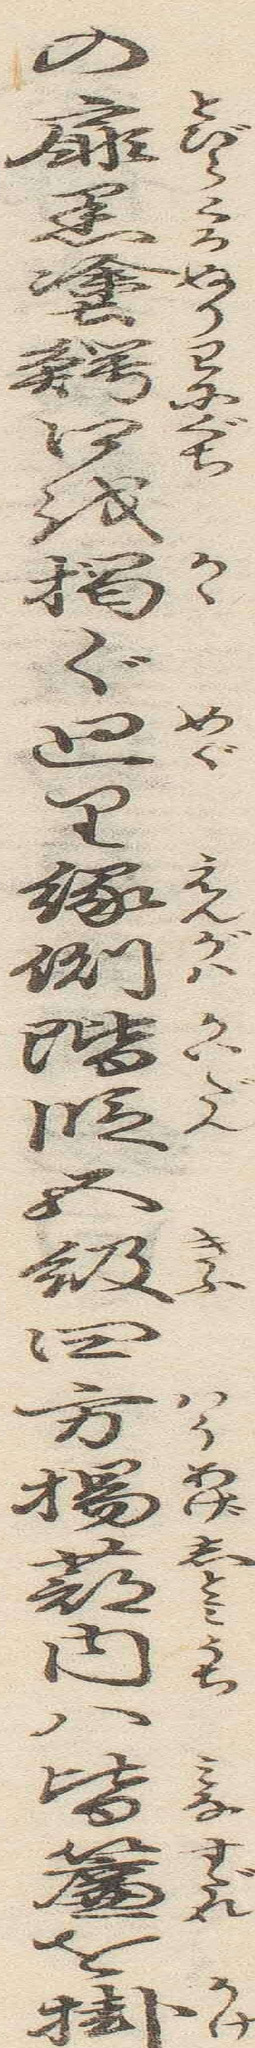の扉黒塗鰐口を掲ぐ廻り縁側階段五級四方揚蔀内は皆簾を掛
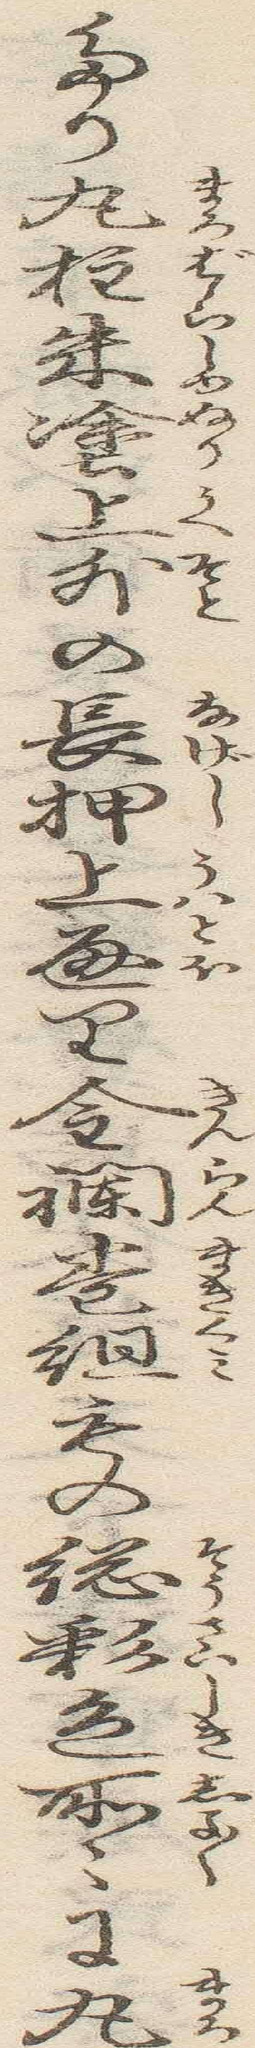たり丸柱朱塗上外の長押上通り金襴巻組もの総彩色所〻に丸
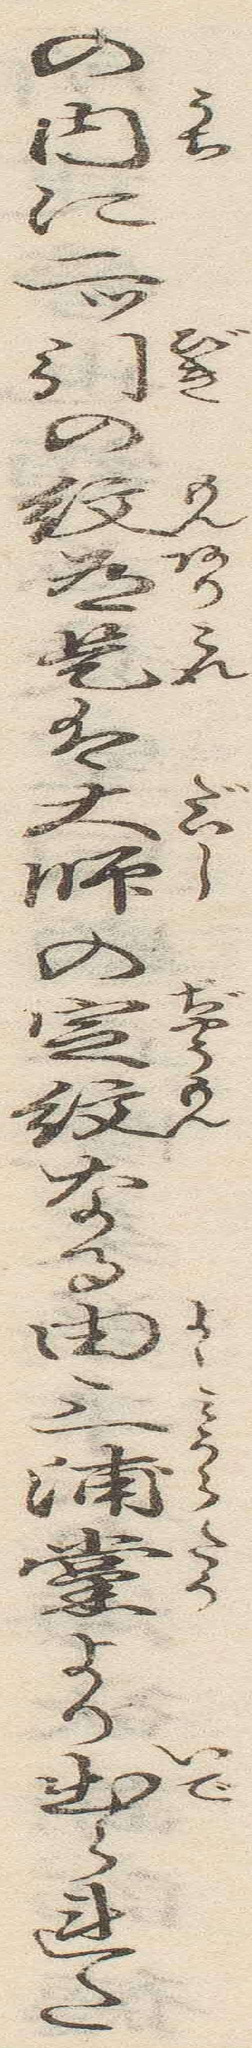の内に二ッ引の紋有是は大師の定紋なる由三浦黨より出られた
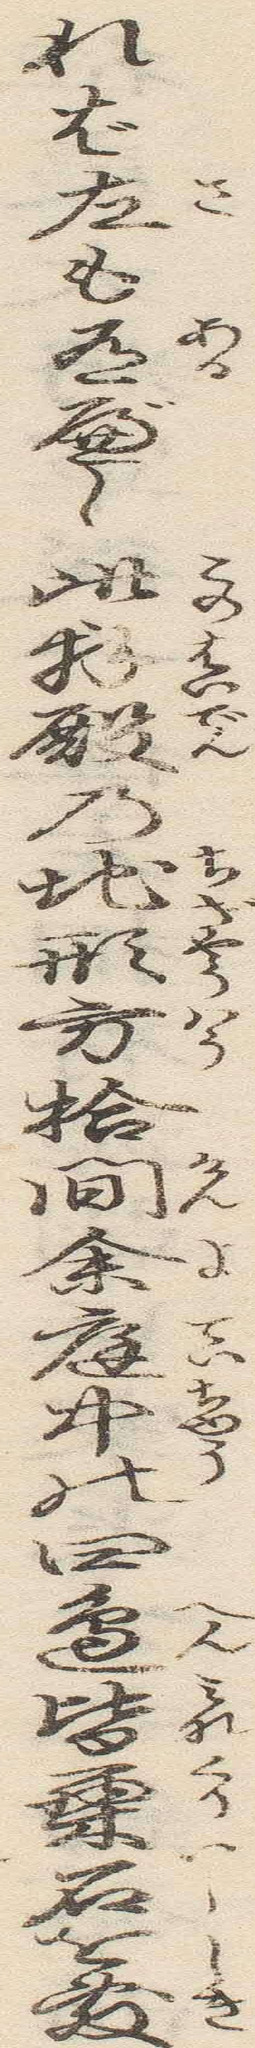れば左も有べし此拜殿の地形方拾間余庭中の四邊皆栗石を敷
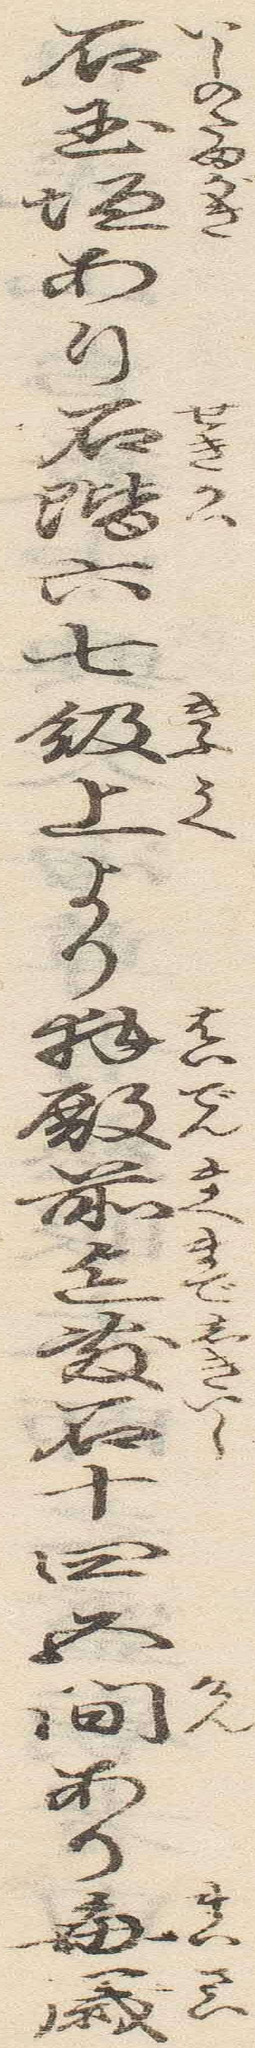石玉垣あり石階六七級上より拜殿前迄敷石十四五間あり毎歳
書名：日光山志
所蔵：東京学芸大学附属図書館 国文学研究資料館
